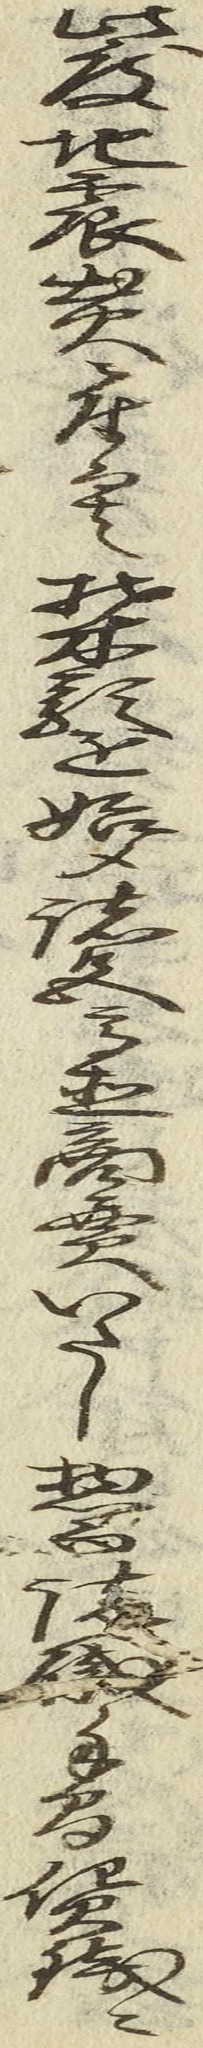此度地震出火ニ付而者材木類を始メ諸色高直商売いたし惣而諸職手間賃銭ニ
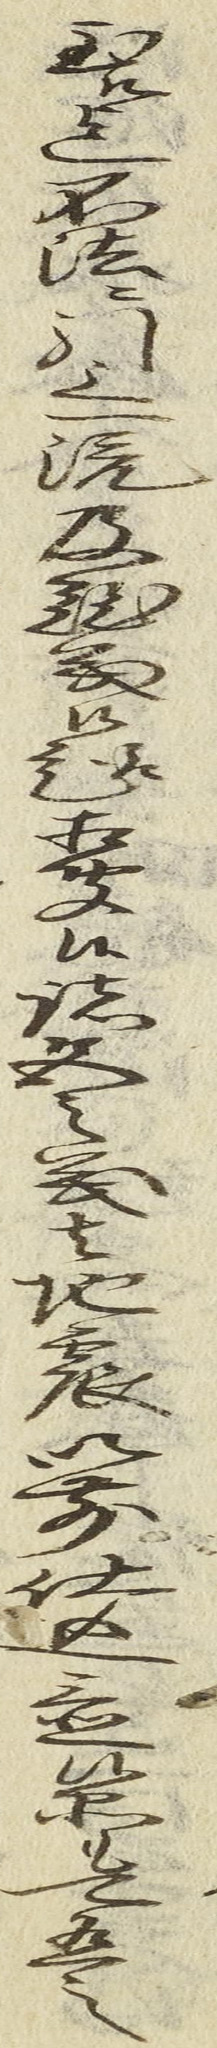至ル迄不法ニ引上一統及難義候趣相聞候諸色之義者地震以前仕込置候品も可有之
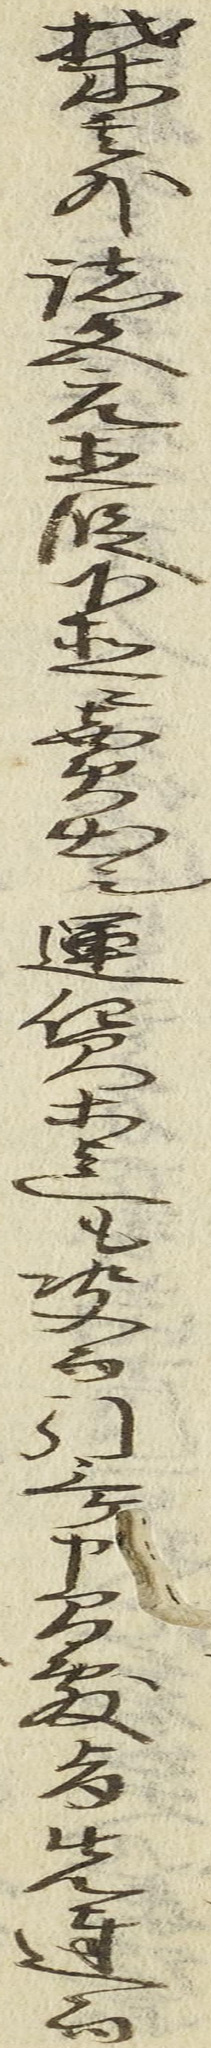材木其外諸色元直段下直ニ売出シ運賃等迄も決而引上ケ申間敷旨先達而
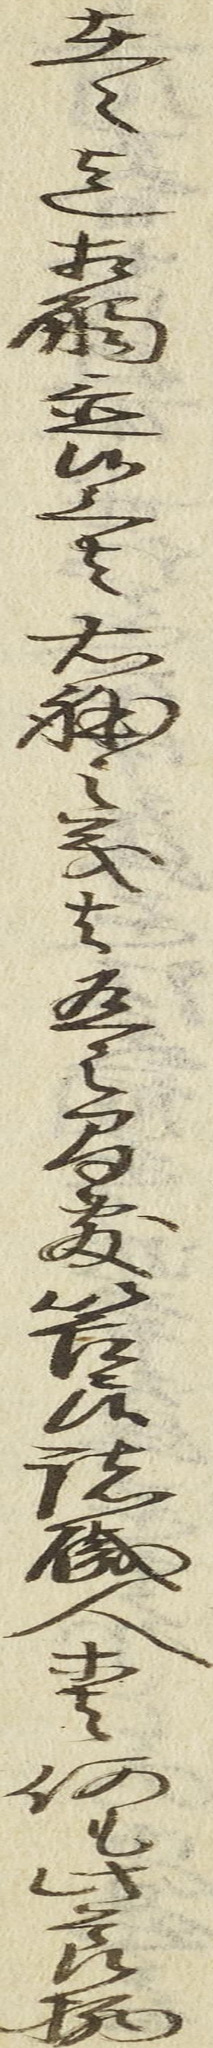在々迄相触置候上者右体之義者有之間敷筈ニ候諸職人等者何も此節柄
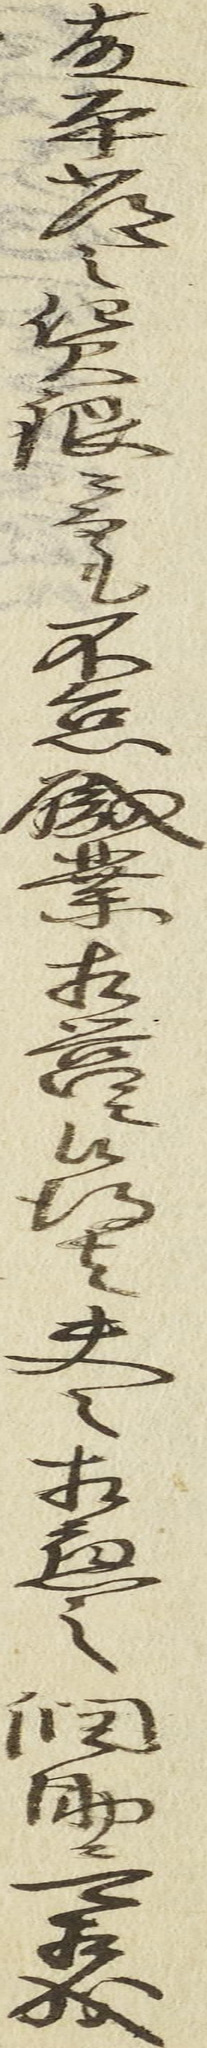故平常之賃銀ニ而も不怠職業相営ニ候得者夫々相応之潤助ニ可相成
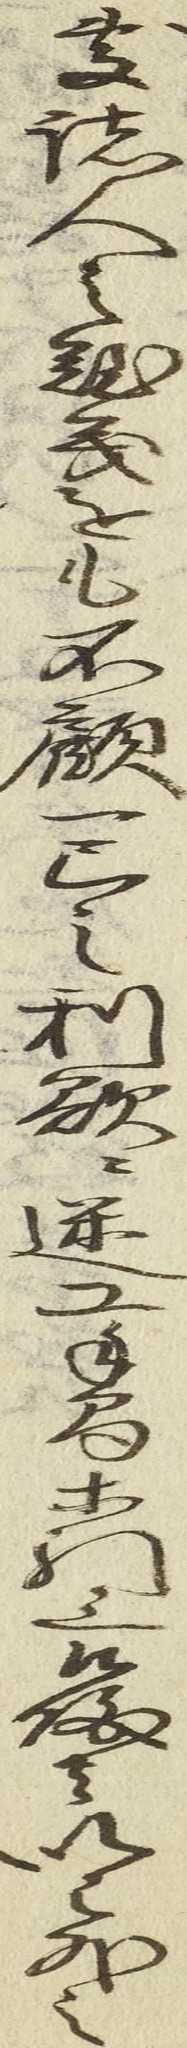処諸人之難義をも不顧一己之利欲ニ迷工手間等引上候儀者以之外之
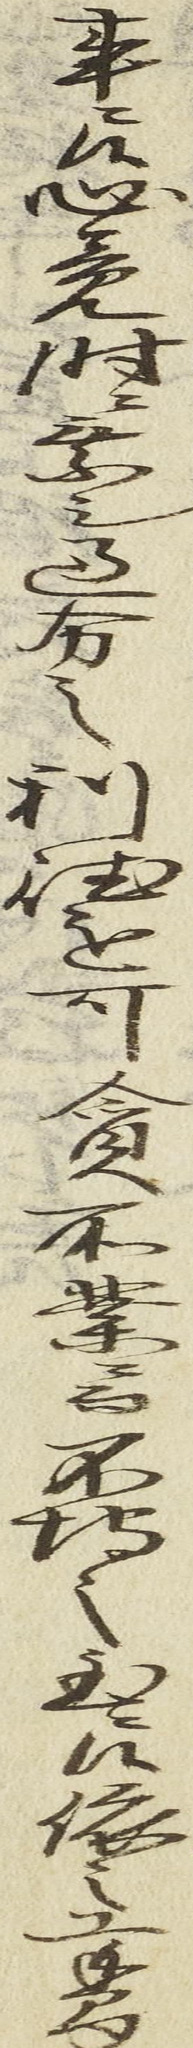事ニ候必竟時ニ乗シ過分之利徳を可貪所業ニ而不埒之至ニ候依之工手間
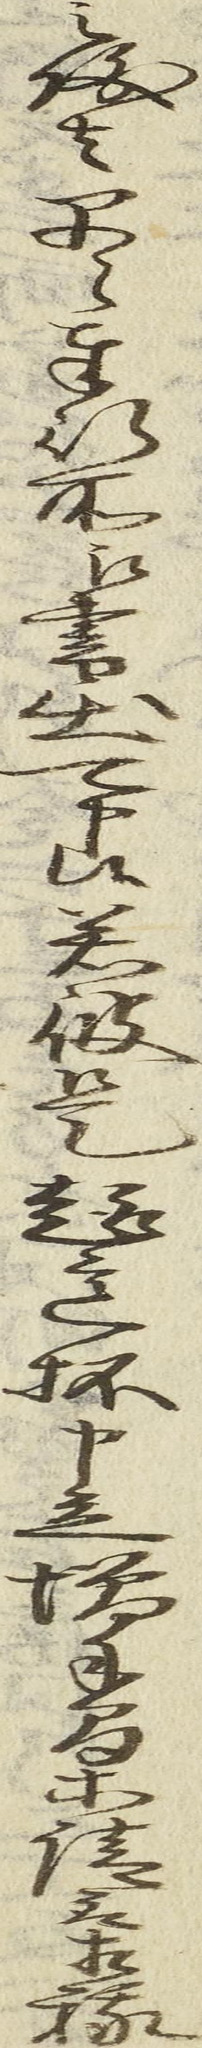之儀者早々奉行所江書出可申候若彼是趣意抔申立増手間等請取相稼
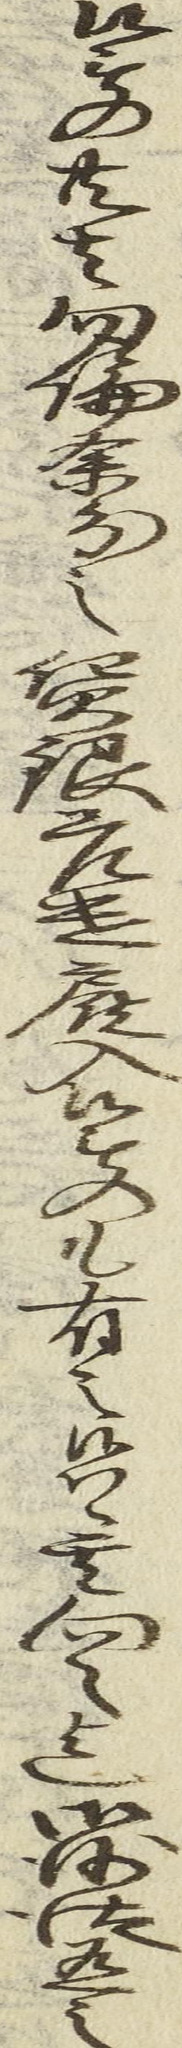候もの共者勿論余分之賃銀差遣雇入候ものも有之候ハヽ其向々迄御沙汰有之
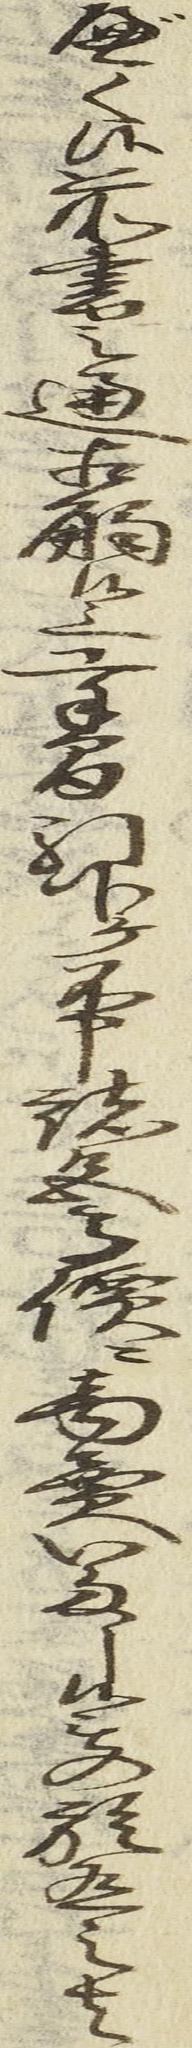べく候前書之通相触候上工手間引下ケ不申諸色高価ニ商売いたし候もの於有之者
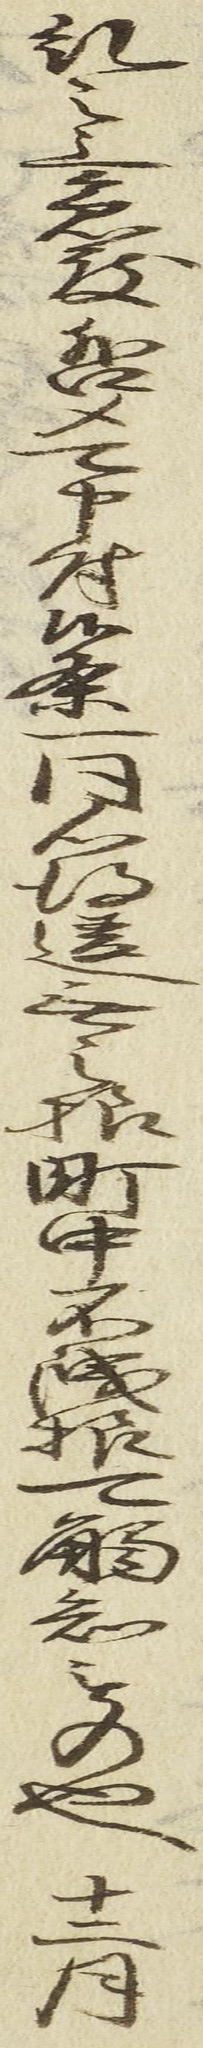糺之上急度咎メ可申付候条一同心得違無之様町中不洩様可触知もの也十二月
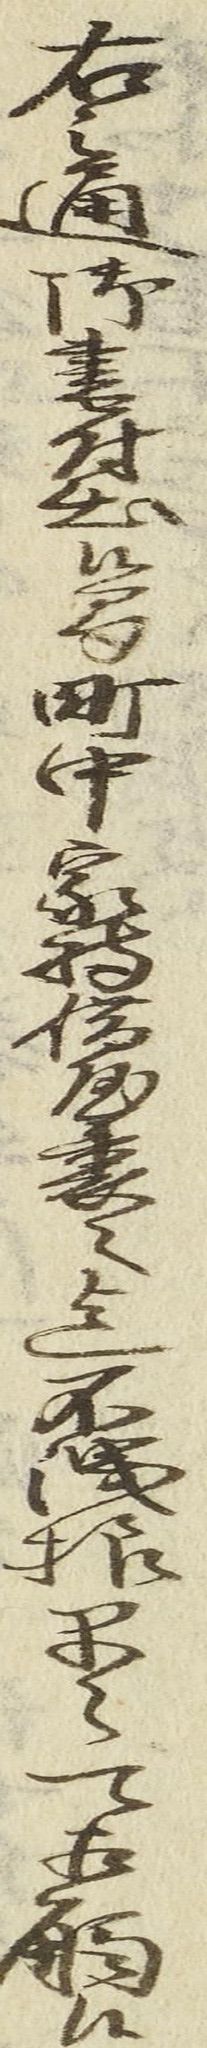右之通御書付出候間町中家持借屋裏々迄不洩様早々可相触候
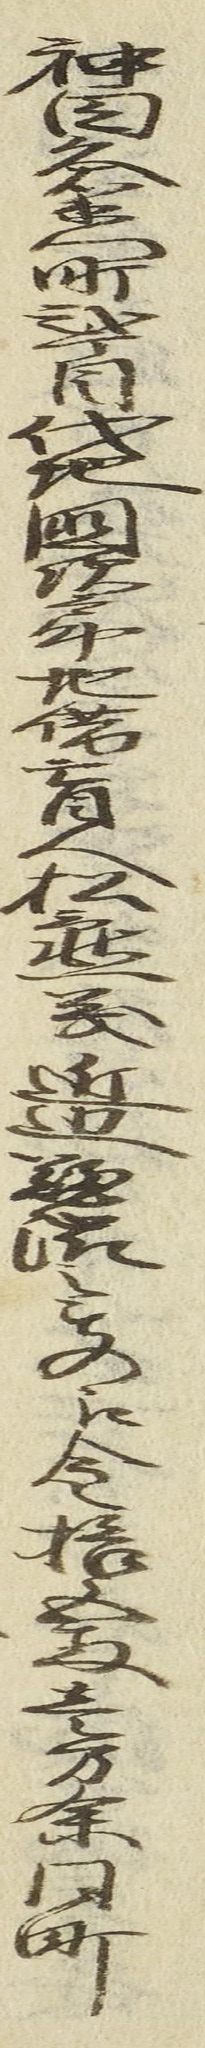一神田久右衛門町弐丁目代地国次郎地借盲人松亀一義近辺難渋之もの江金拾五両壱分余同町
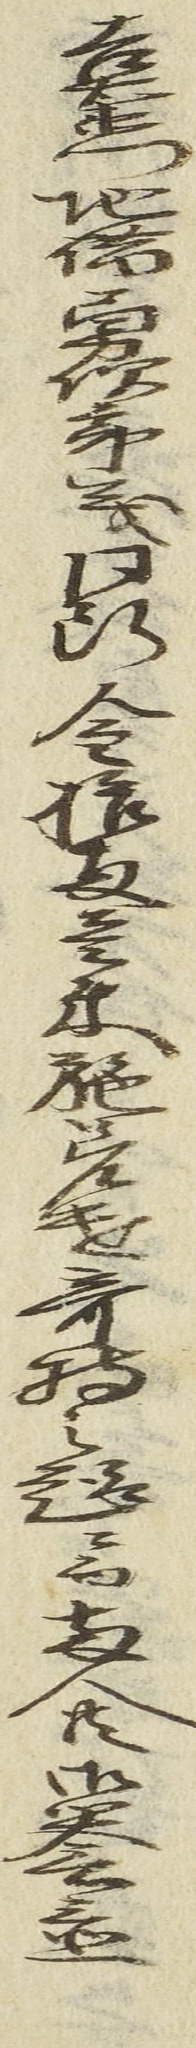吉右衛門地借勇次郎義同断金拾両壱朱施差遣奇特之趣ニ而両人共御誉置

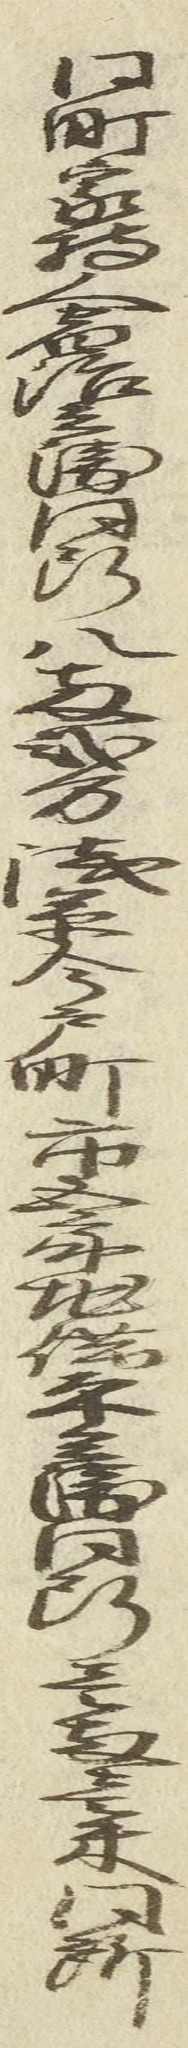一同町家持人宿治兵衛同断八両弐分浅草今戸町市五郎地借平兵衛同断壱両壱朱同所
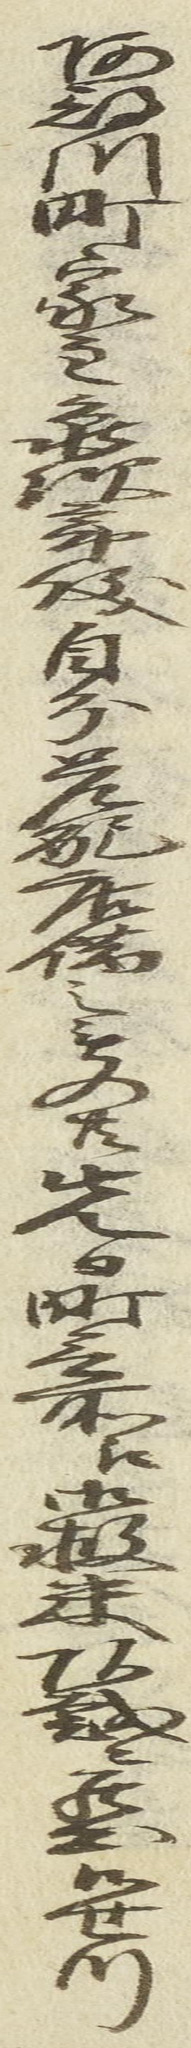阿部川町家主亀次郎儀自分差配店借之もの共先日町会所江御救米頂戴ニ罷出候せつ
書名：安政二年震災記事　完
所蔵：東京大学地震研究所図書室 Earthquake Research Institute Library, The University of Tokyo, JAPAN
